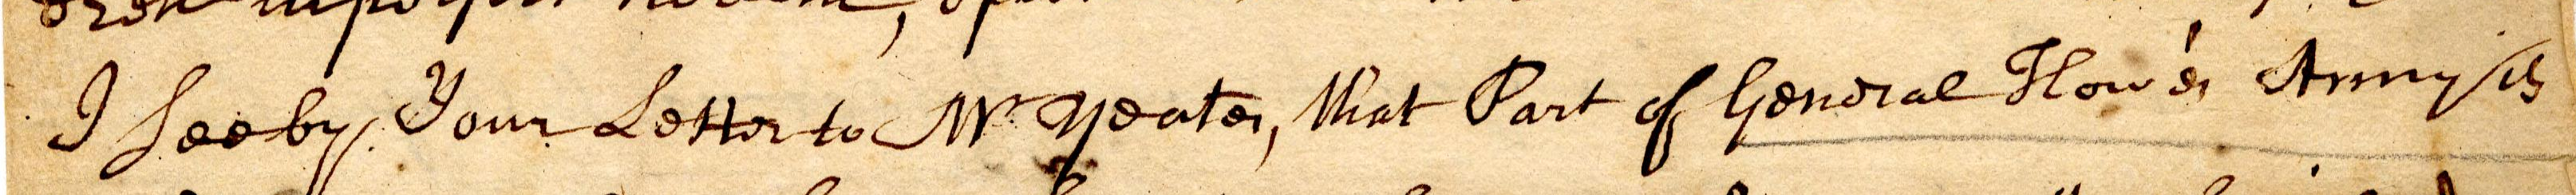I see by Your Letter to M^r Yeates, that Part of General How's Army is
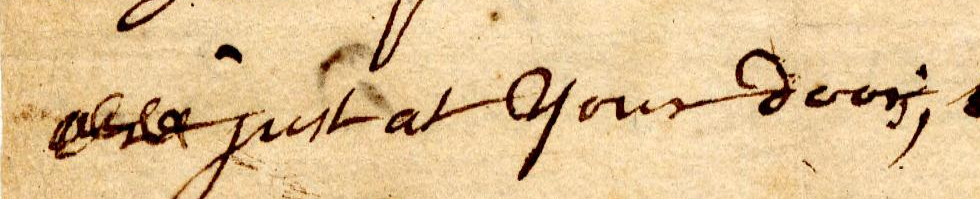[____] just at Your door;
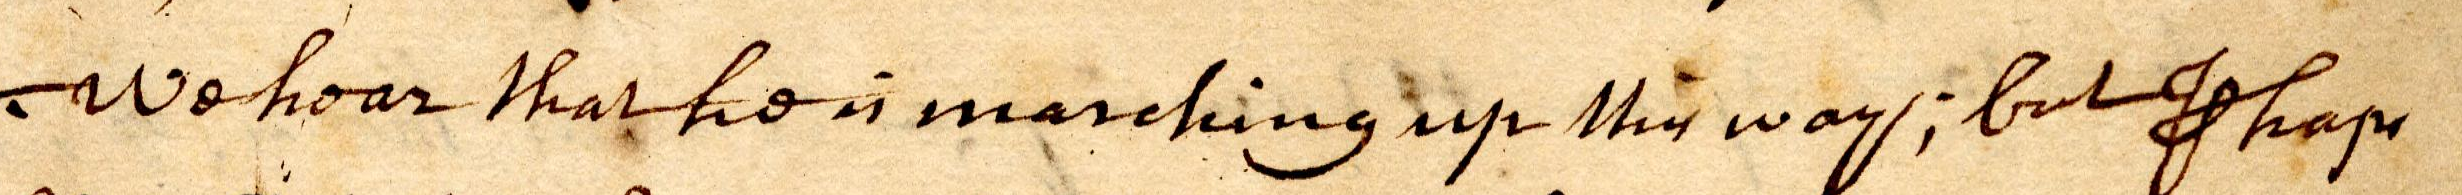We hear that he is marching up this way; but perhaps
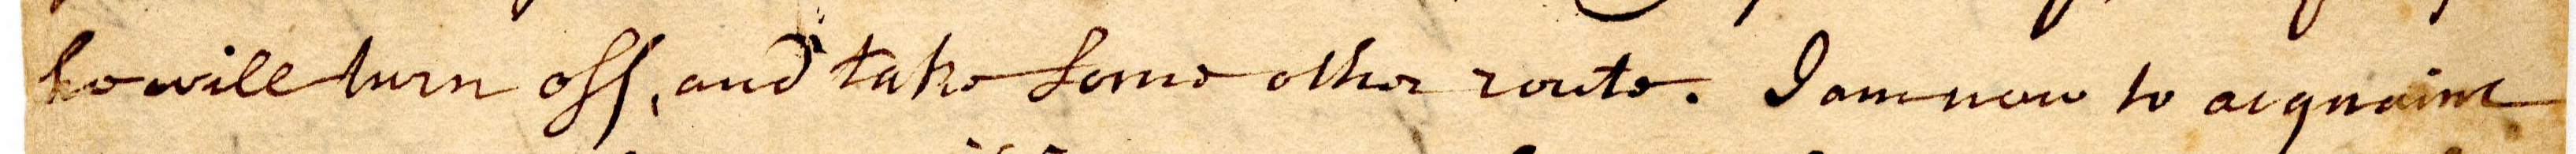he will turn off, and take some other route. I am now to acquaint
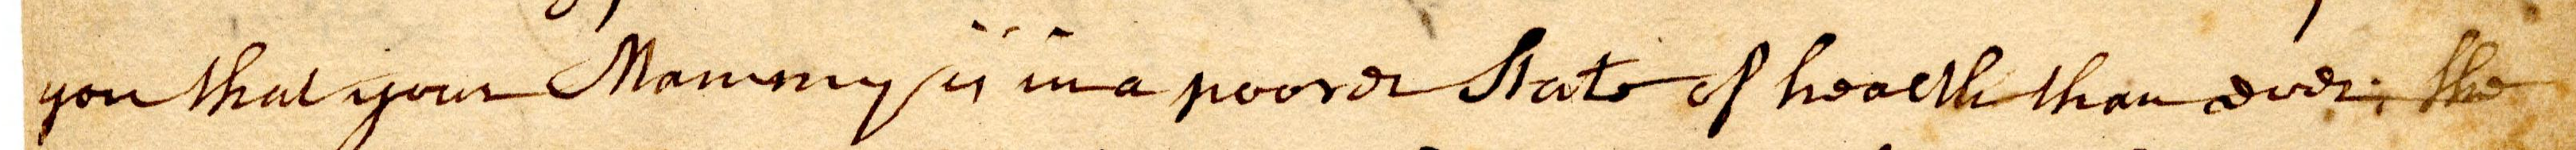you that your Mammy is in a poorer State of health than ever; she
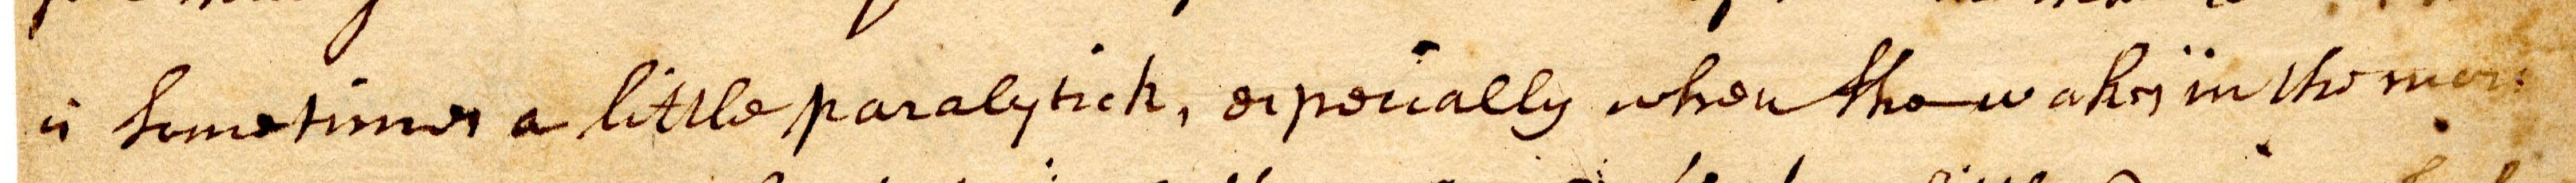is sometimes a little paralytick, especially when she waks in the mor:
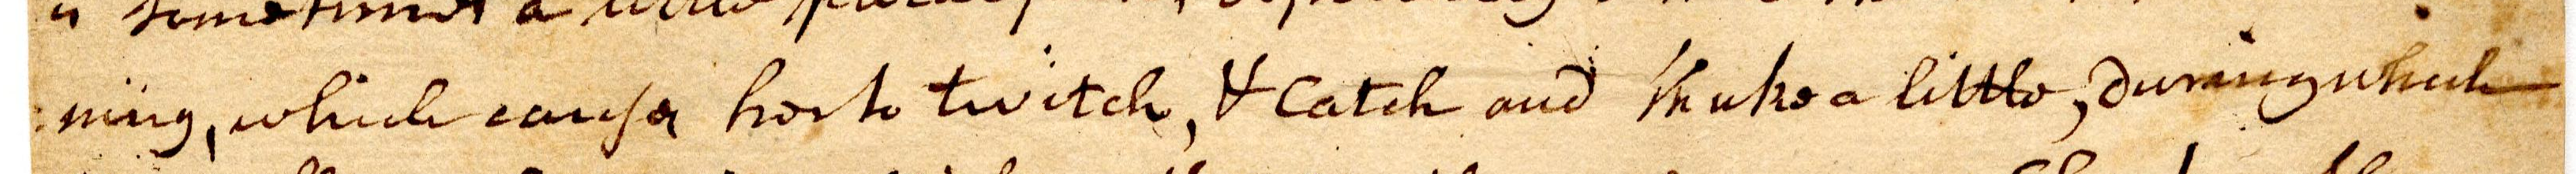:ning, which causes her to twitch, & catch and shake a little, during which
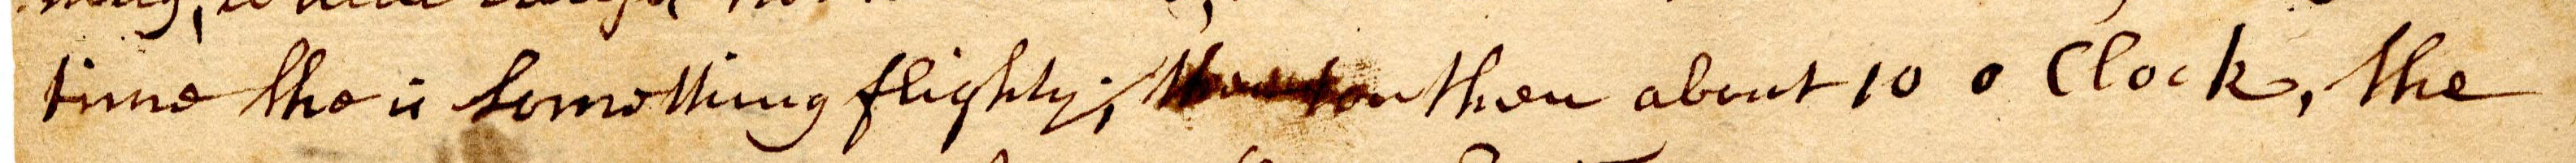time she is something flighty; [_____] then about 10 o Clock, she
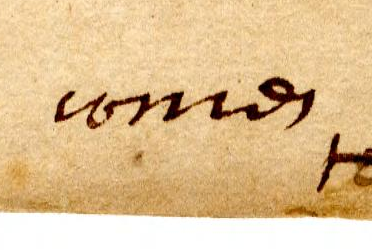comes
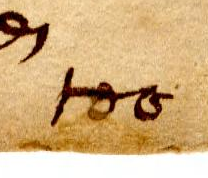too
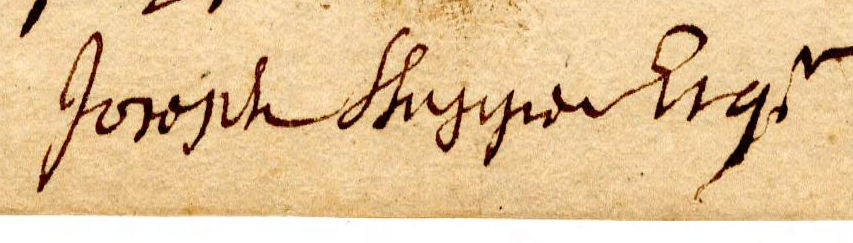Joseph Shippen Esq^r
